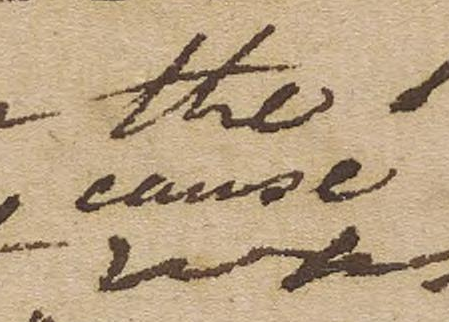cause
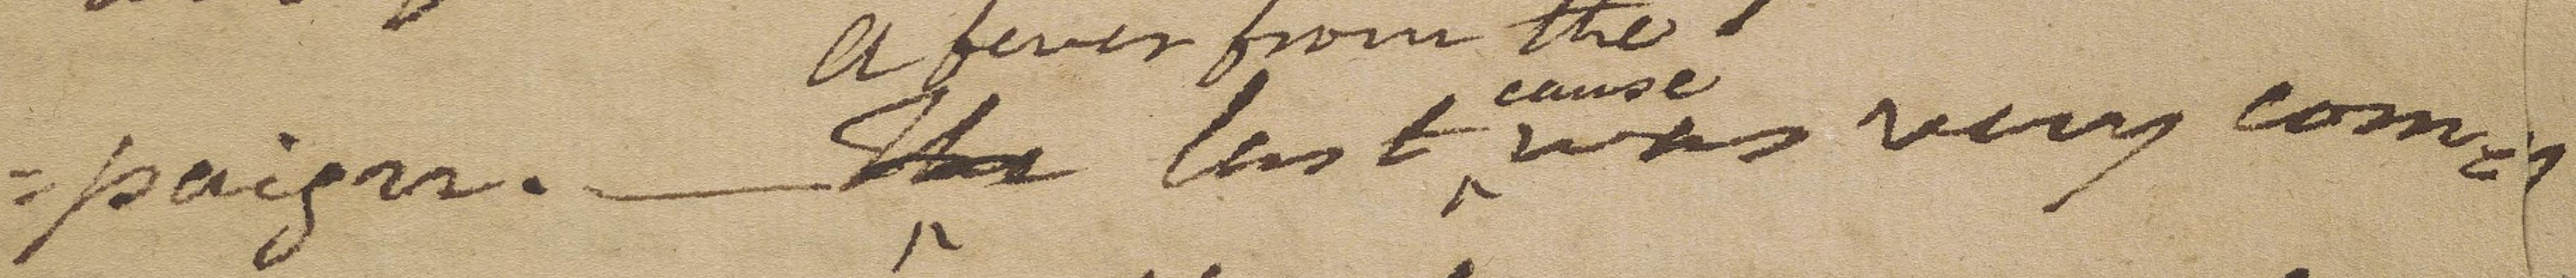-paign.- ^ [The] last ^ was very com-
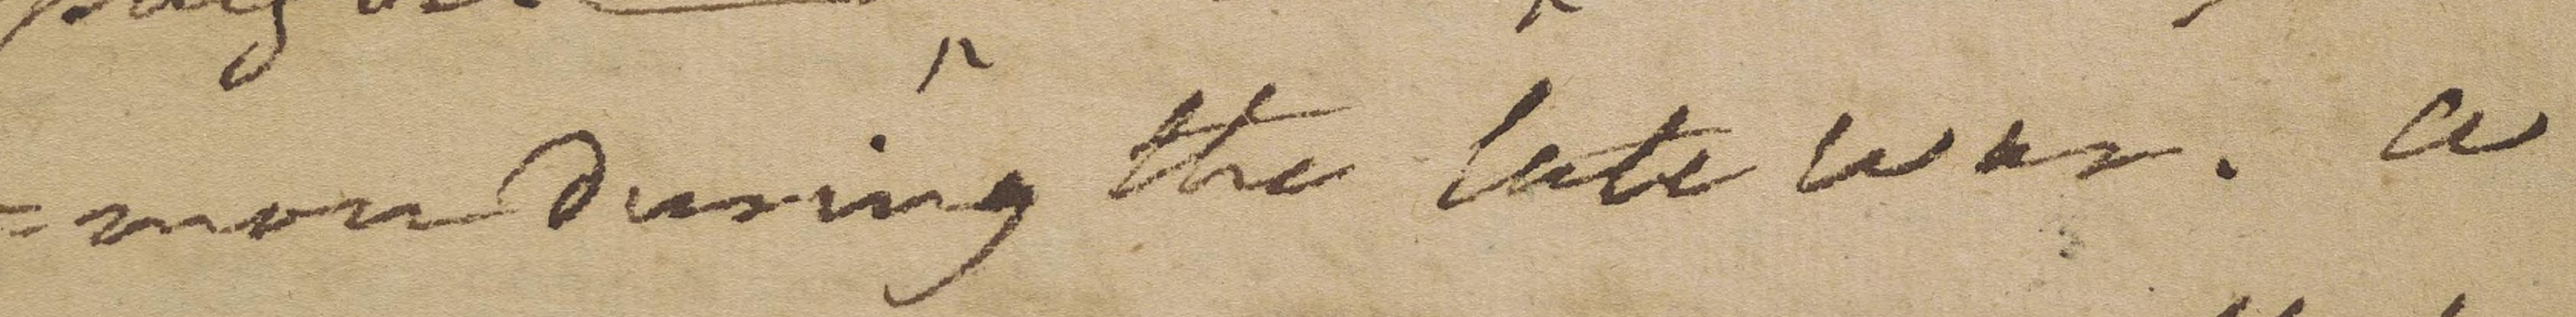-mon during the late war. A
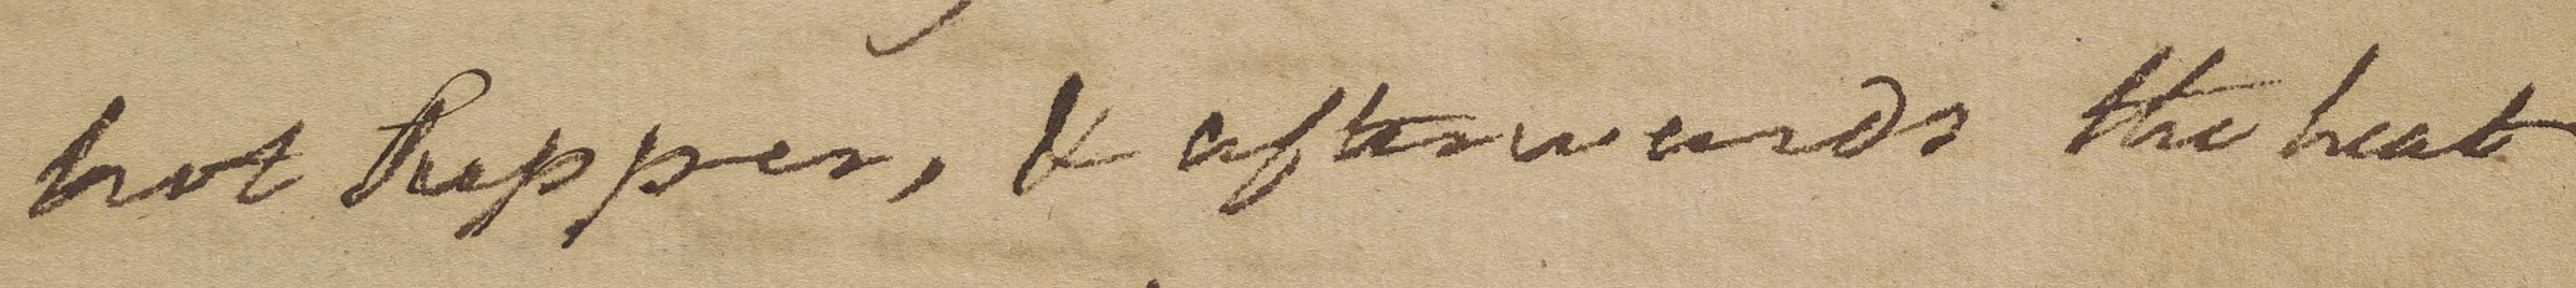hot pepper, & afterwards the heat
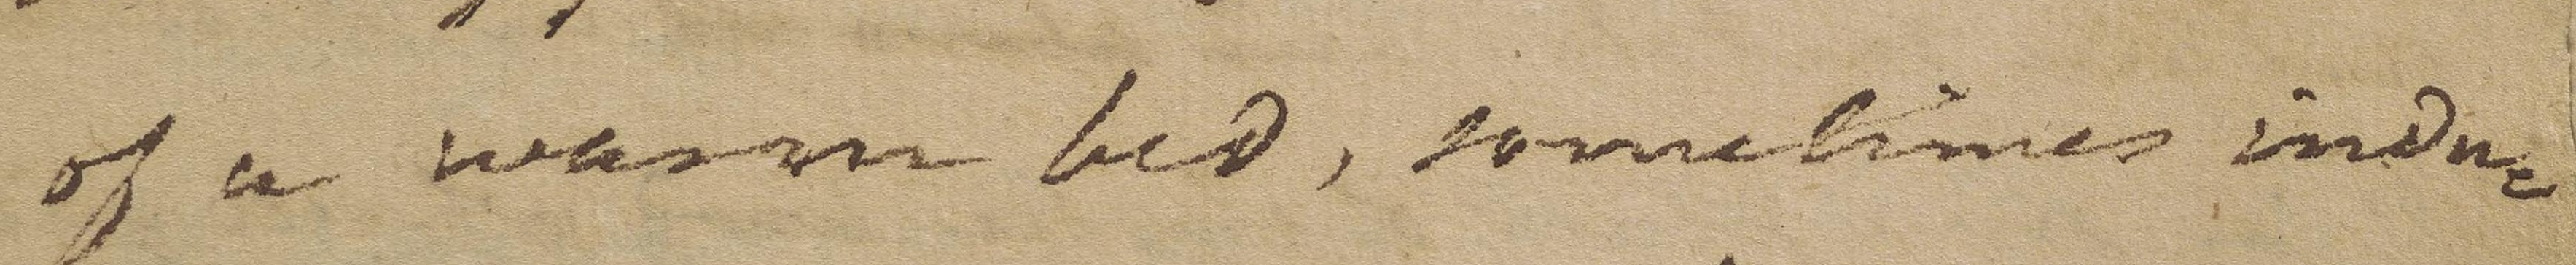of a warm bed, somtimes indu-
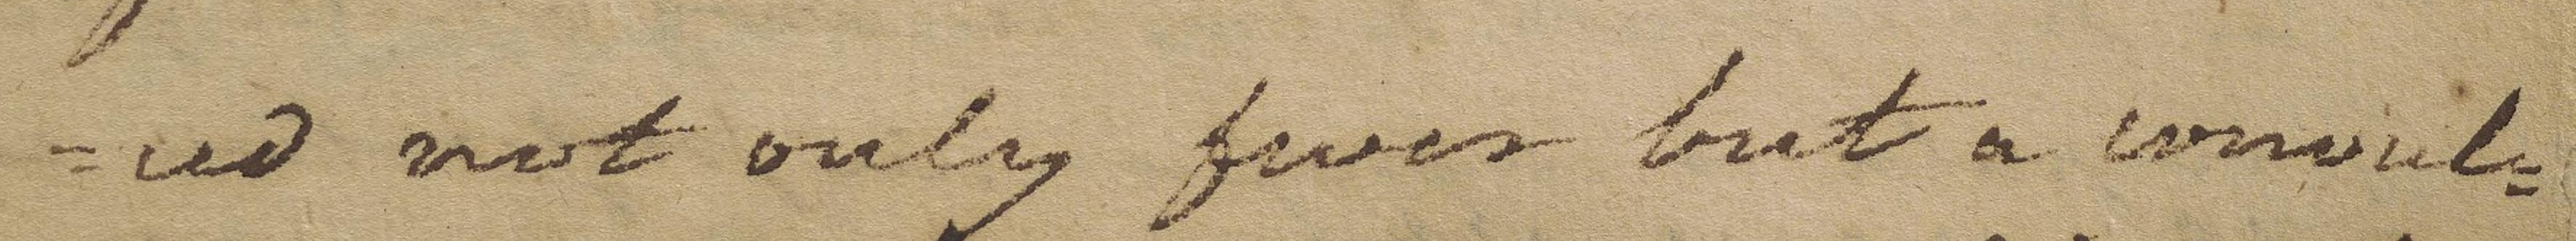ced not only fever but a convul-
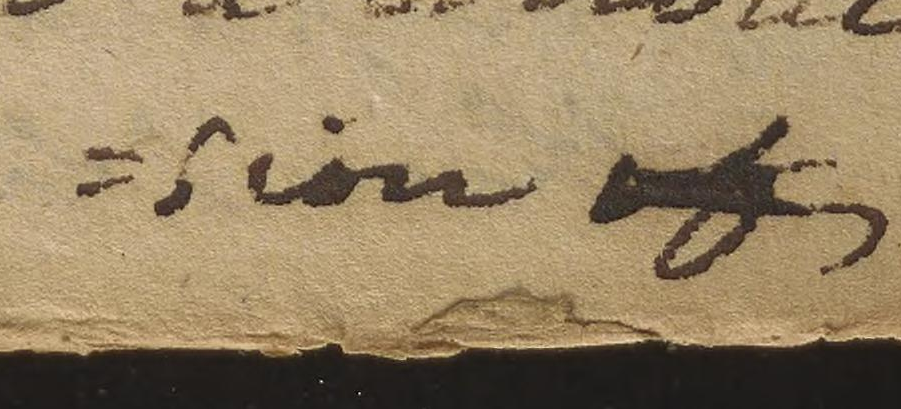-sion [of]
